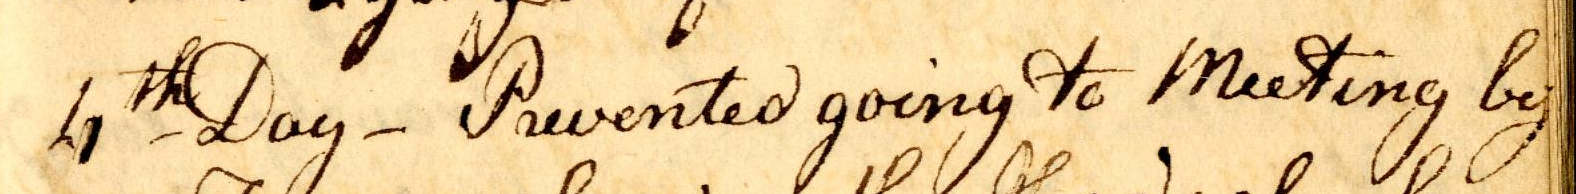4^th Day- Prevented going to Meeting by
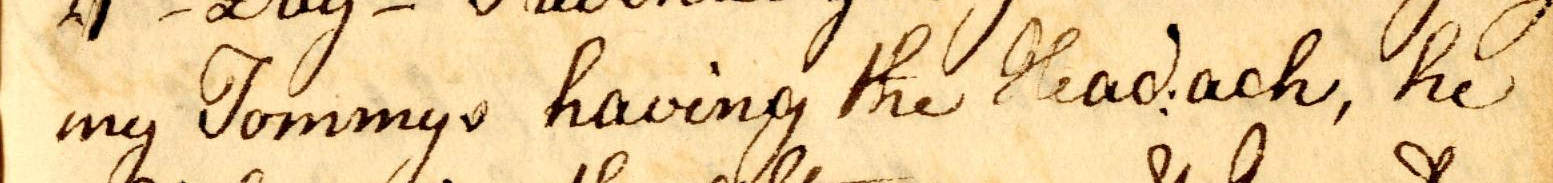my Tommys having the Head:ach, he
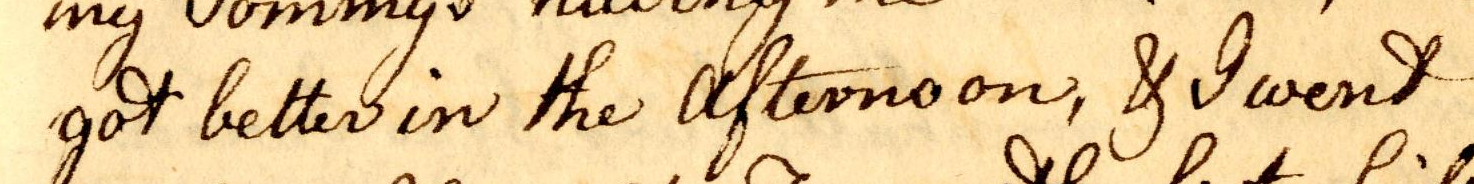got better in the Afternoon, & I went
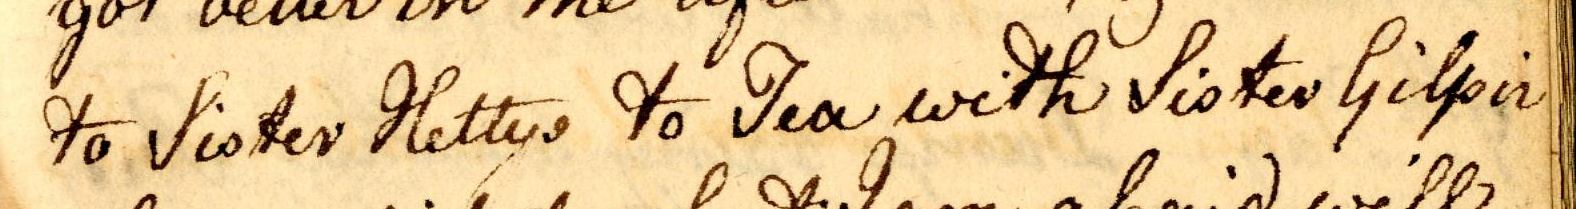to Sister Hettys to Tea with Sister Gilpin
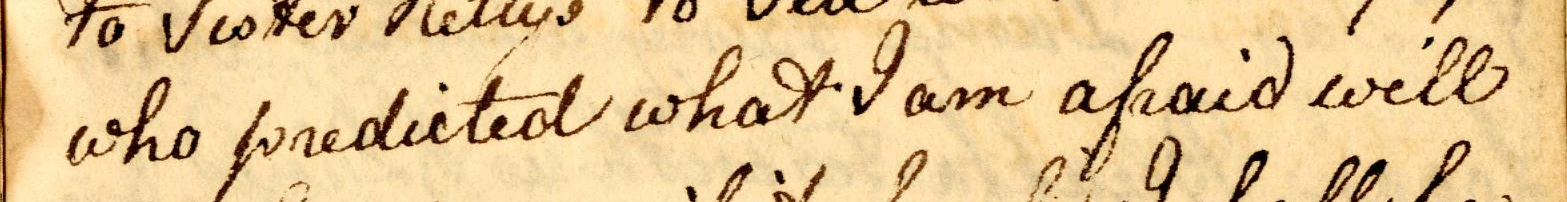who predicted what I am afraid will
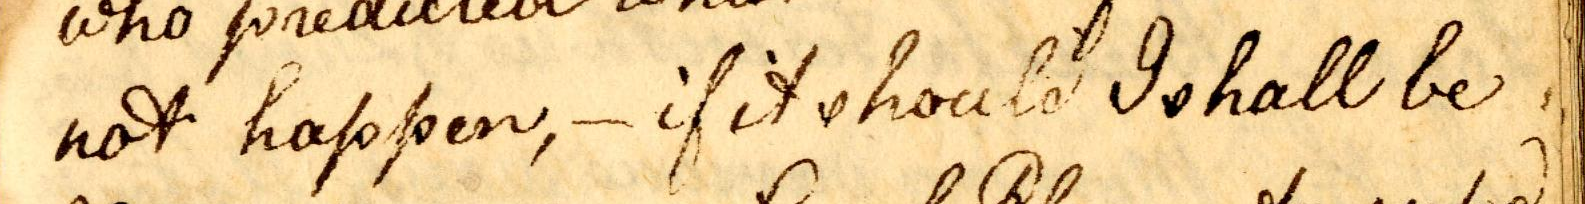not happen,- if it should I shall be,
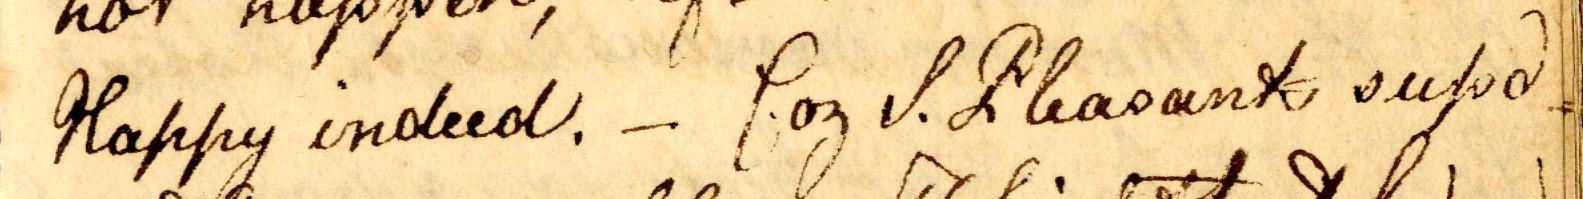Happy indeed,- Coz S. Pleasants supd
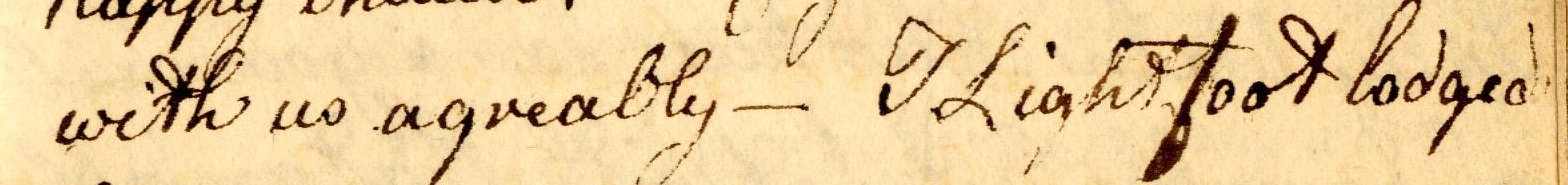with us agreably- T Lightfoot lodged
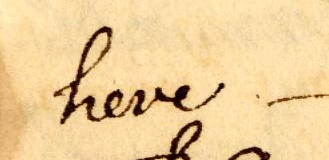here
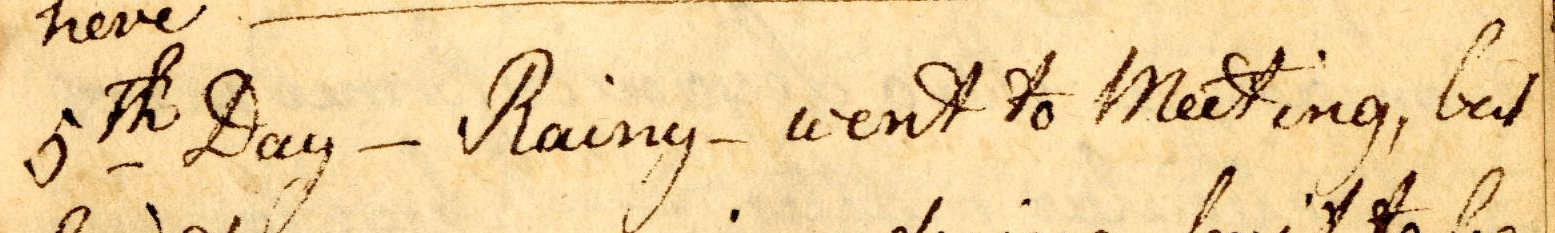5^th Day- Rainy- went to Meeting, but
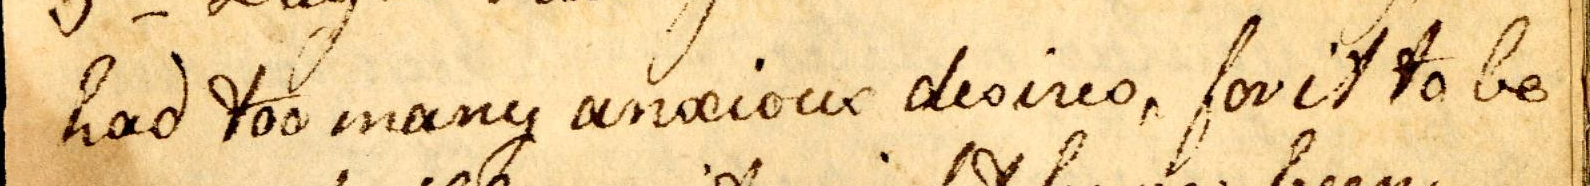had too many anxious desires, for it to be
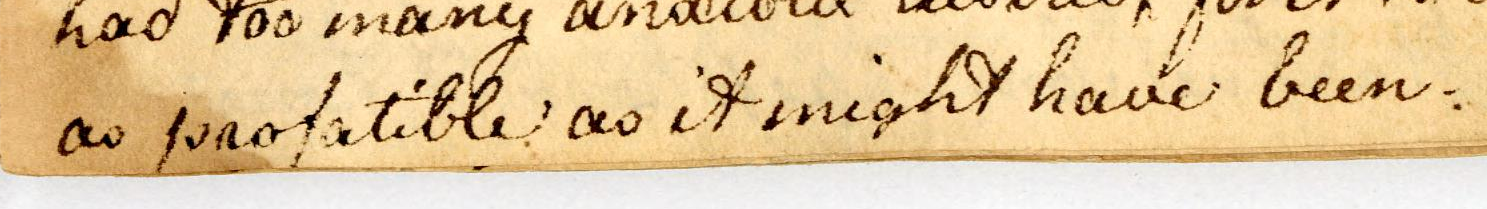as profatible as it might have been.
